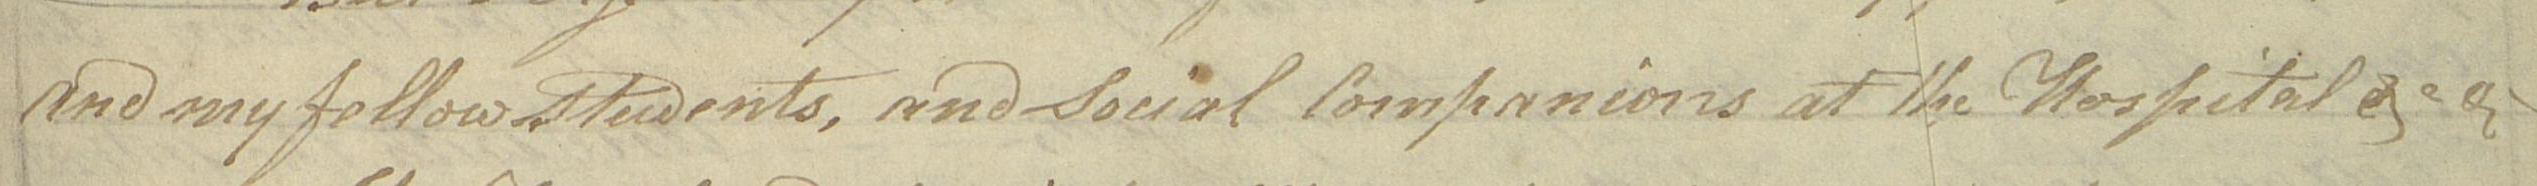and my follow Students, and Social Companions at the Hospital &^c &^c
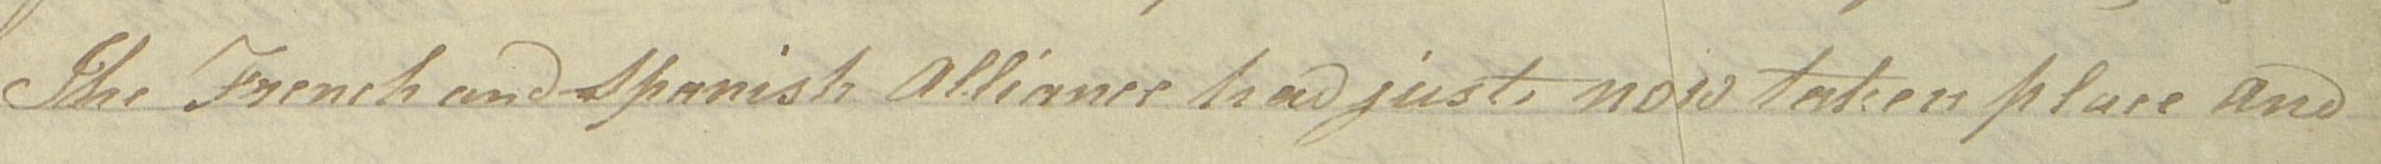The French and Spanish Alliance had just now taken place and
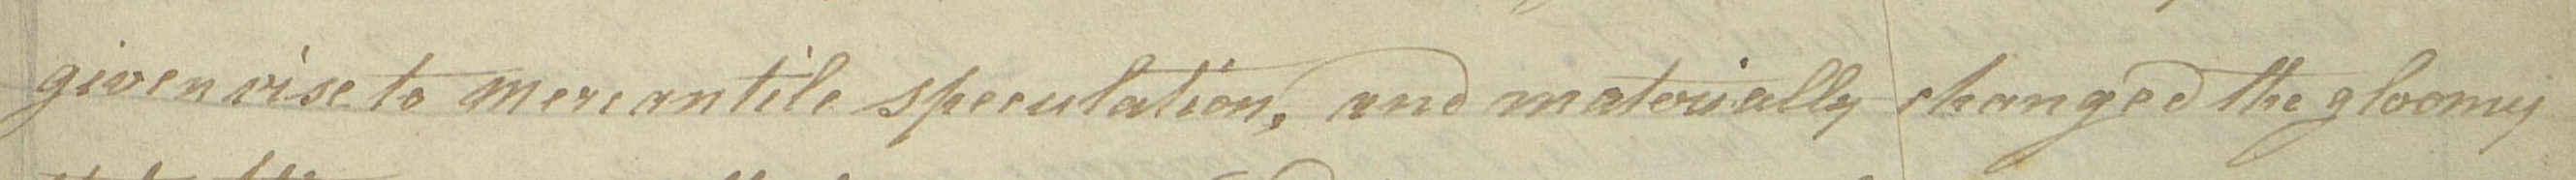given rise to mercantile speculation, and materially changed the gloomy
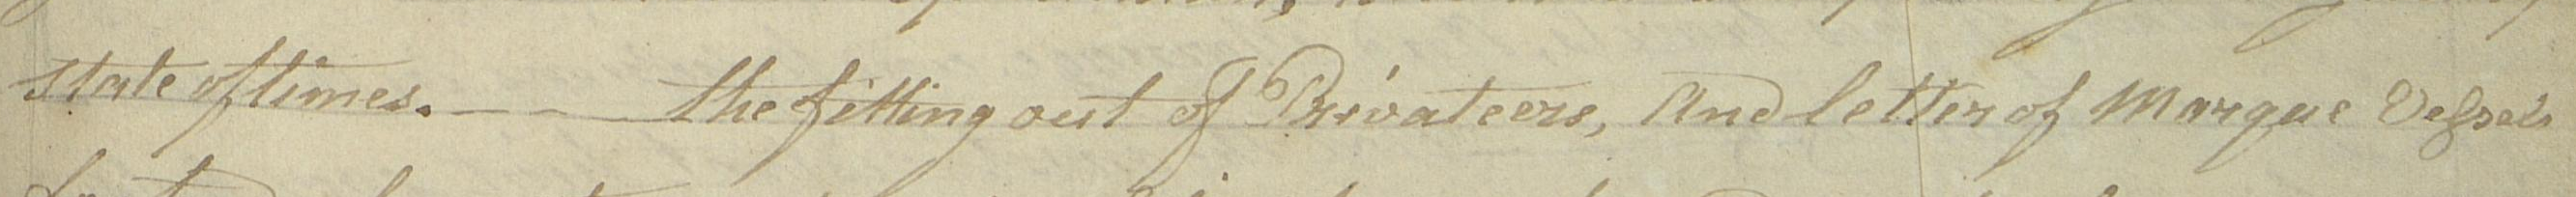state of times. The fitting out of Privateers, And letter of Morgue Vessels
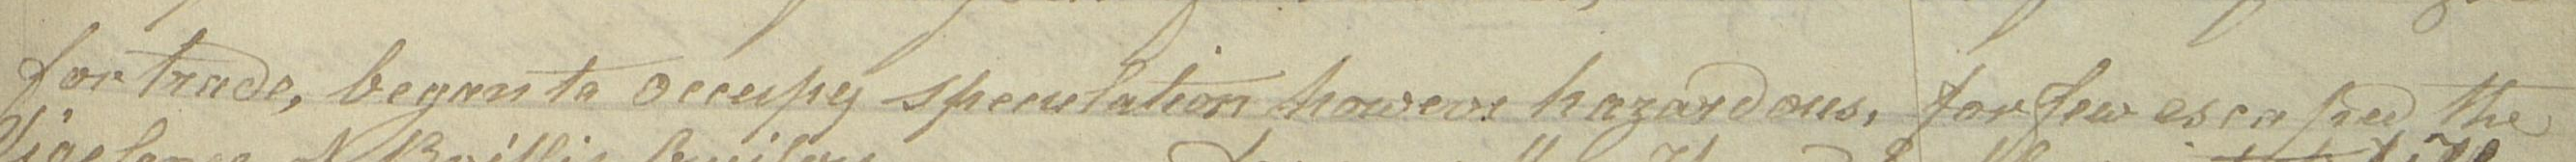for trade, began to occupy speculation however hazardous, for few escaped the
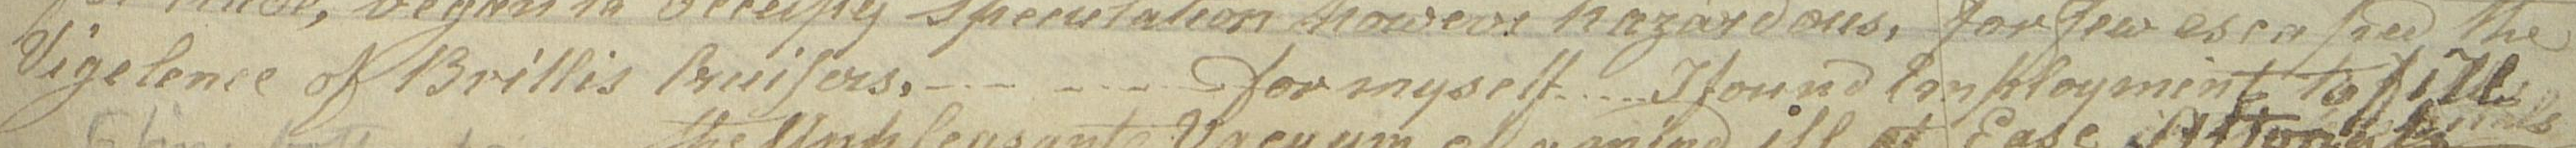Vigilence of Brittis Bruifsers, for myself.... I found Employment to fill
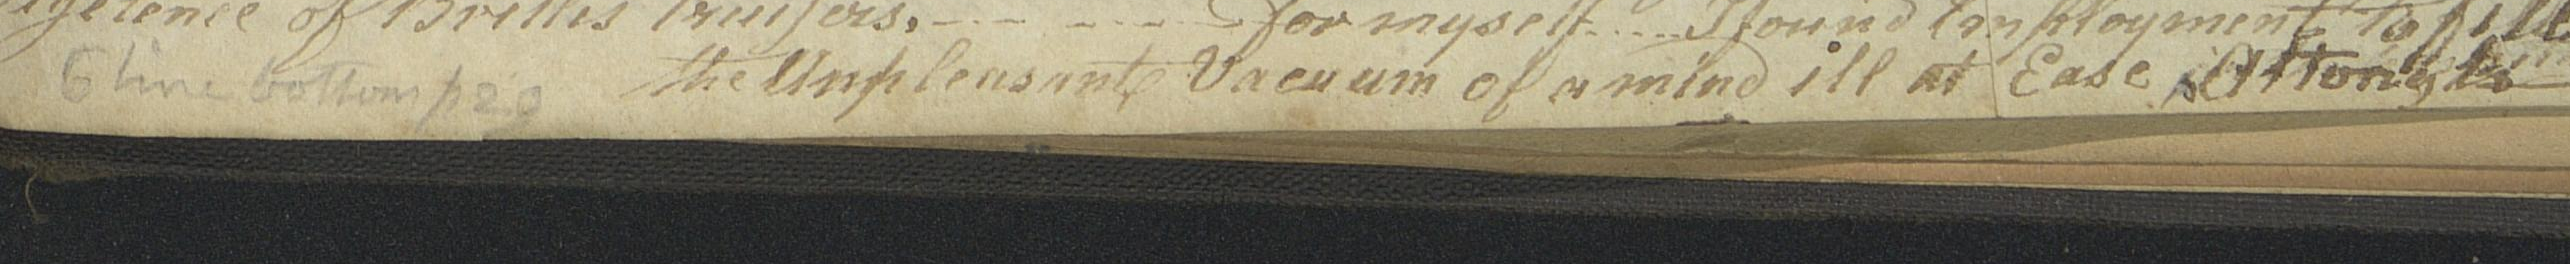Chine bottom p20 the unpleasant Vacuum of a mind ill at East Atton 9 20
